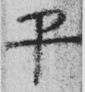子
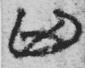凶
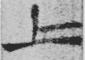上
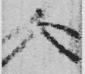六
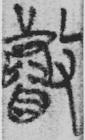○（浚）
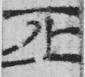○（恆）
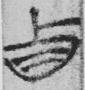貞
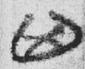凶
